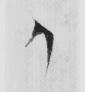人
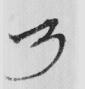乃
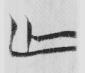亡
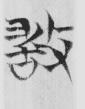敢
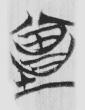增
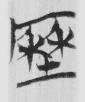{厤土}
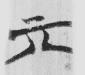亓
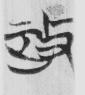政
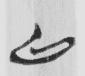㠯（以）
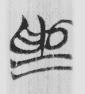爲
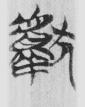獻
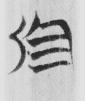於
